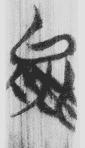能
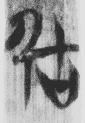居
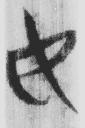女
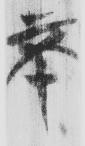不
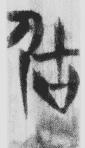居
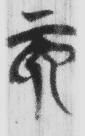而
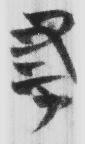{又主}
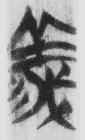義
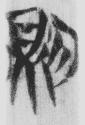則
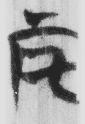厇
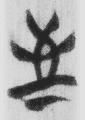至
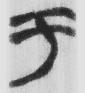于
